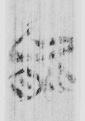能
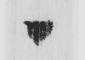丁
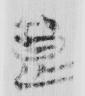良
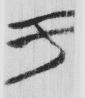于
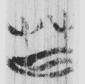{友日}
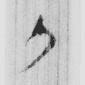人
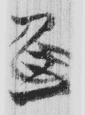廼
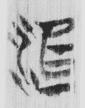洹
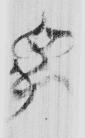弔
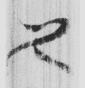氒
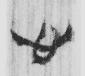心
